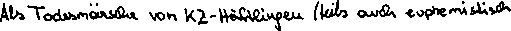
Als Todesmärsche von KZ-Häftlingen (teils auch euphemistisch
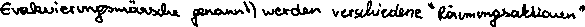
Evakuierungsmärsche genannt) werden verschiedene "Räumungsaktionen"
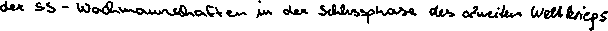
der SS-Wachmannschaften in der Schlussphase des Zweiten Weltkriegs
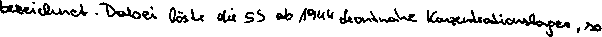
bezeichnet. Dabei löste die SS ab 1944 frontnahe Konzentrationslager, so
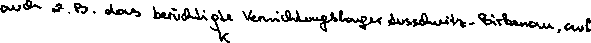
auch z. B. das berüchtigte Vernichtungslager Auschwitz-Birkenau, auf
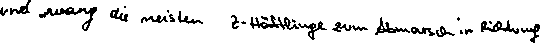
und zwang die meisten KZ-Häftlinge zum Abmarsch in Richtung
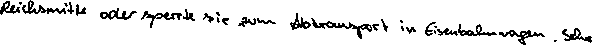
Reichsmitte oder sperrte sie zum Abtransport in Eisenbahnwagen. Sehr
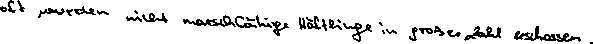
oft wurden nicht marschfähige Häftlinge in großer Zahl erschossen.
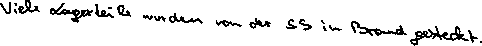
Viele Lagerteile wurden von der SS in Brand gesetzt.
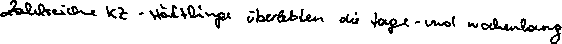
Zahlreiche KZ-Häftlinge überlebten die tage- und wochenlang
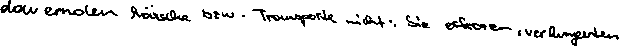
dauernden Märsche bzw. Transporte nicht: Sie erfroren, verhungerten
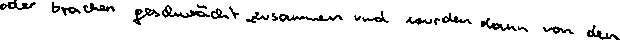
oder brachen geschwächt zusammen und wurden dann von den
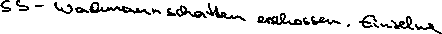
SS-Wachmannschaften erschossen. Einzelne
